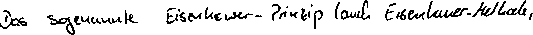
Das sogenannte Eisenhower-Prinzip (auch: Eisenhower-Methode,
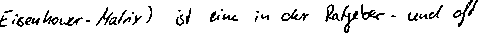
Eisenhower-Matrix) ist eine in der Ratgeber- und oft
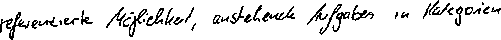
referenzierte Möglichkeit, anstehende Aufgaben in Kategorien
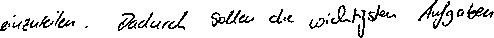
einzuteilen. Dadurch sollen die wichtigsten Aufgaben
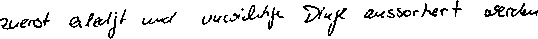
zuerst erledigt und unwichtige Dinge aussortiert werden
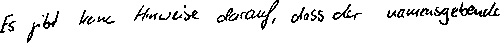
Es gibt keine Hinweise darauf, dass der namensgebende
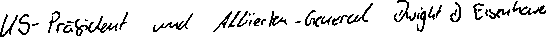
US-Präsident und Alliierten-General Dwight D. Eisenhower
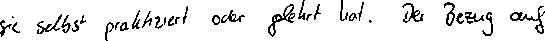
sie selbst praktiziert oder gelehrt hat. Der Bezug auf
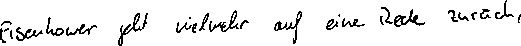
Eisenhower geht vielmehr auf eine Rede zurück,
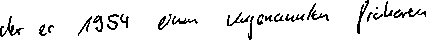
der er 1954 einen ungenannten früheren
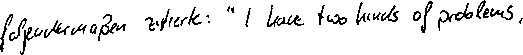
folgendermaßen zitierte: "I have two kinds of problems,
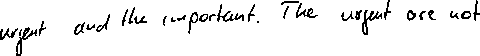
urgent and the important. The urgent are not
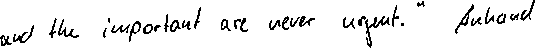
and the important are never urgent."Anhand
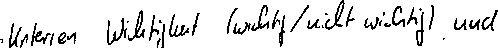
Kriterien Wichtigkeit (wichtig/nicht wichtig) und
